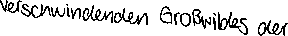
verschwindenden Großwildes der
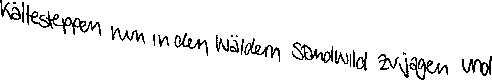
Kältesteppen nun in den Wäldern Standwild zu jagen und
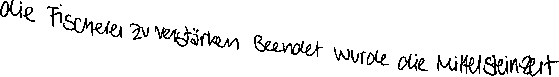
die Fischerei zu verstärken. Beendet wurde die Mittelsteinzeit
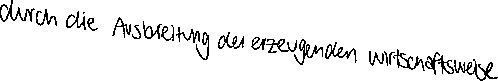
durch die Ausbreitung der erzeugenden Wirtschaftsweise
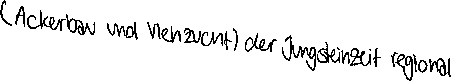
(Ackerbau und Viehzucht) der Jungsteinzeit regional
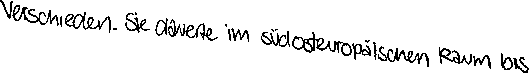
verschieden. Sie dauerte im südosteuropäischen Raum bis
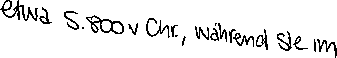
etwa 5.800 v. Chr., während sie im
